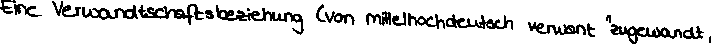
Eine Verwandtschaftsbeziehung (von mittelhochdeutsch verwant "zugewandt,
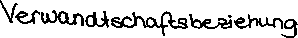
Verwandtschaftsbeziehung
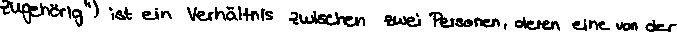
zugehörig") ist ein Verhältnis zwischen zwei Personen, deren eine von der
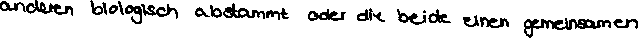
anderen biologisch abstammt oder die beide einen gemeinsamen
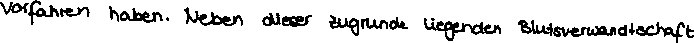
Vorfahren haben. Neben dieser zugrunde liegenden Blutsverwandtschaft
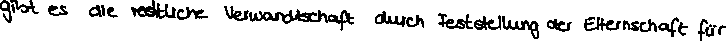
gibt es die rechtliche Verwandtschaft durch Feststellung der Elternschaft für
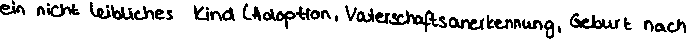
ein nicht leibliches Kind (Adoption, Vaterschaftsanerkennung, Geburt nach
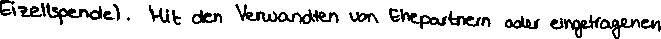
Eizellspende). Mit den Verwandten von Ehepartnern oder eingetragenen
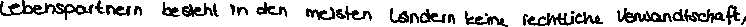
Lebenspartnern besteht in den meisten Ländern keine rechtliche Verwandtschaft,
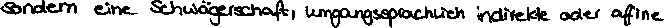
sondern eine Schwägerschaft, umgangssprachlich indirekte oder affine
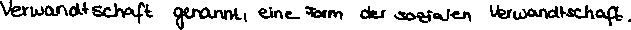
Verwandtschaft genannt, eine Form der sozialen Verwandtschaft.
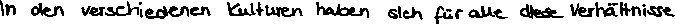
In den verschiedenen Kulturen haben sich für alle diese Verhältnisse
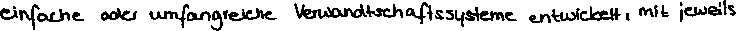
einfache oder umfangreiche Verwandtschaftssysteme entwickelt, mit jeweils
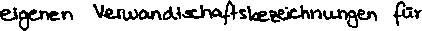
eigenen Verwandtschaftsbezeichnungen für
